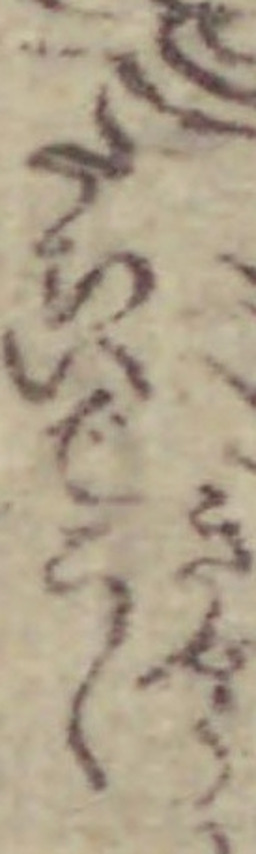たちいでこゝ
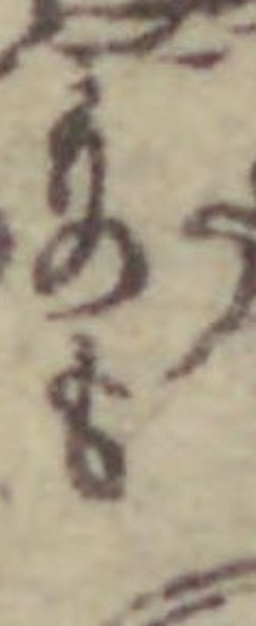ものも
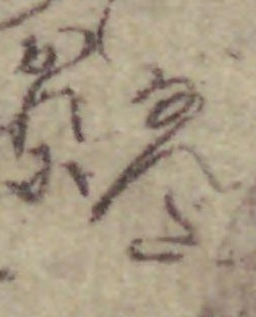おれに
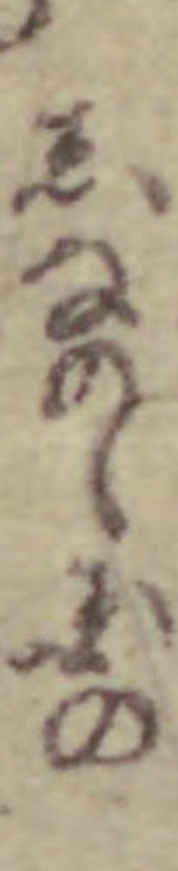しなのゝ国の
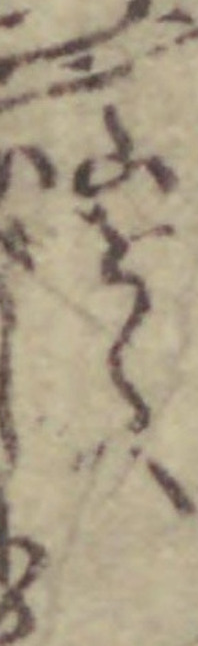山をくへ
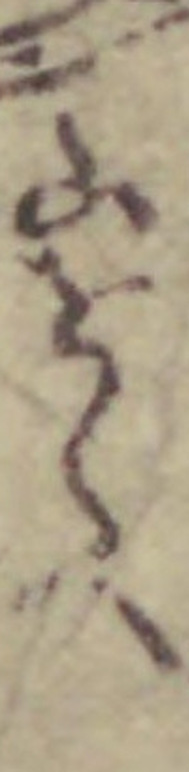山をくへ
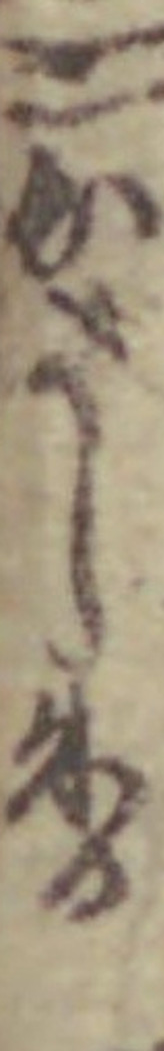心ざし来る

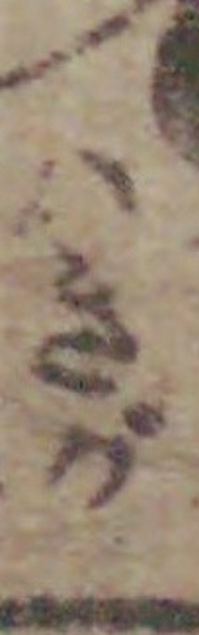いきが
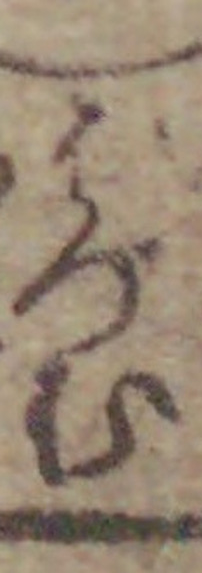はづむ
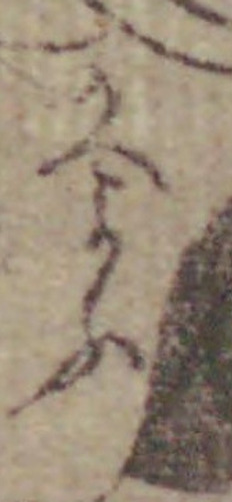かへよふ
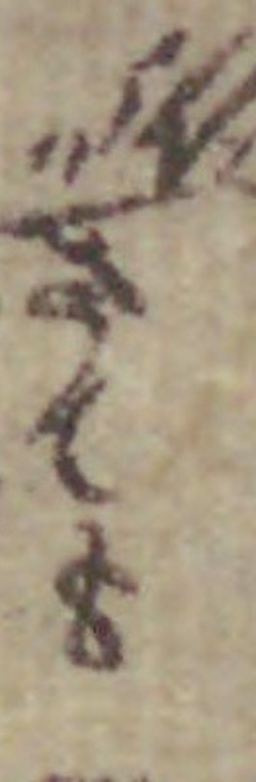さても
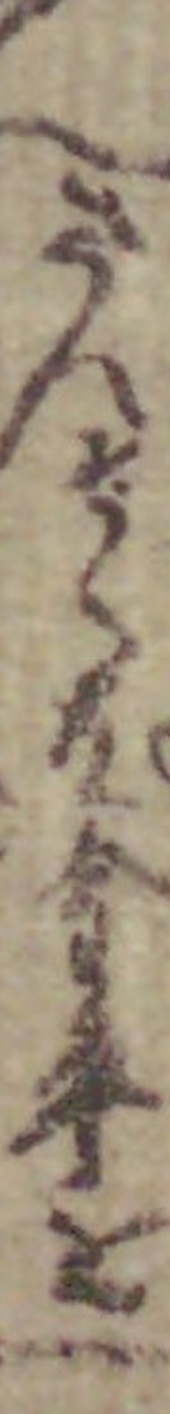さんぞくは金平を
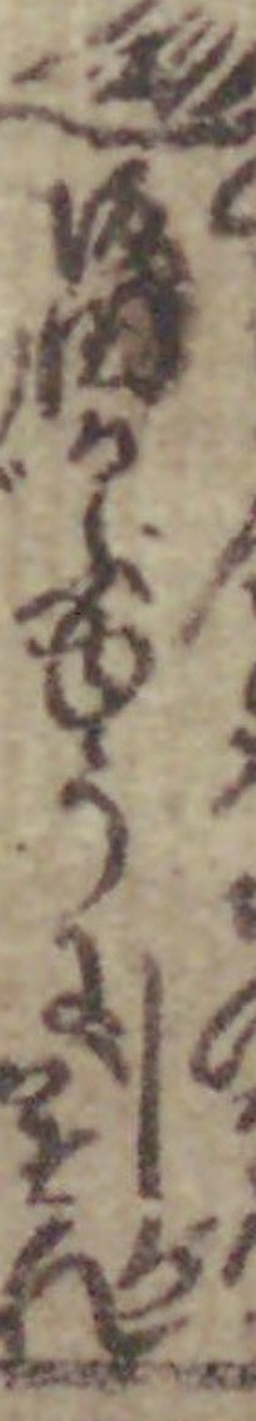坂田かぶゆうにおそれ
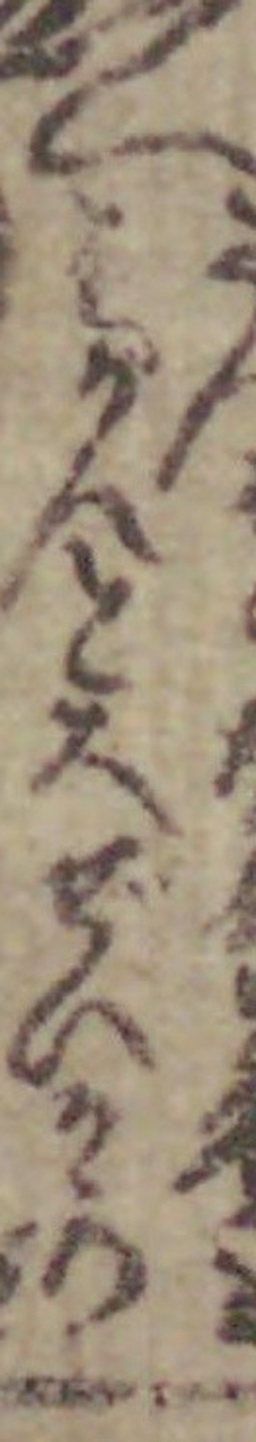はがんと大ぜいかゝり
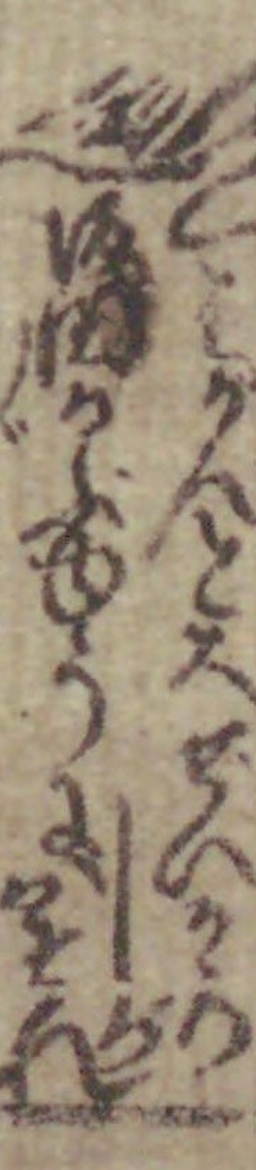坂田かぶゆうにおそれ
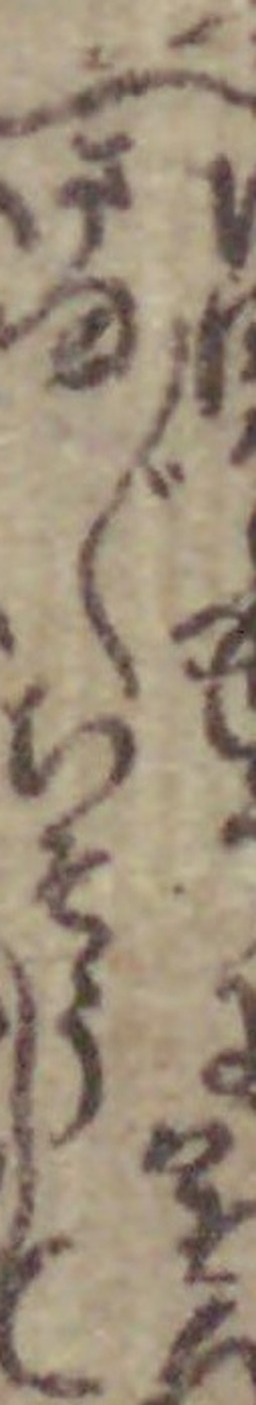さま〴〵ちそうして
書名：妖怪雪濃段 2巻
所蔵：国立国会図書館 National Diet Library, JAPAN
